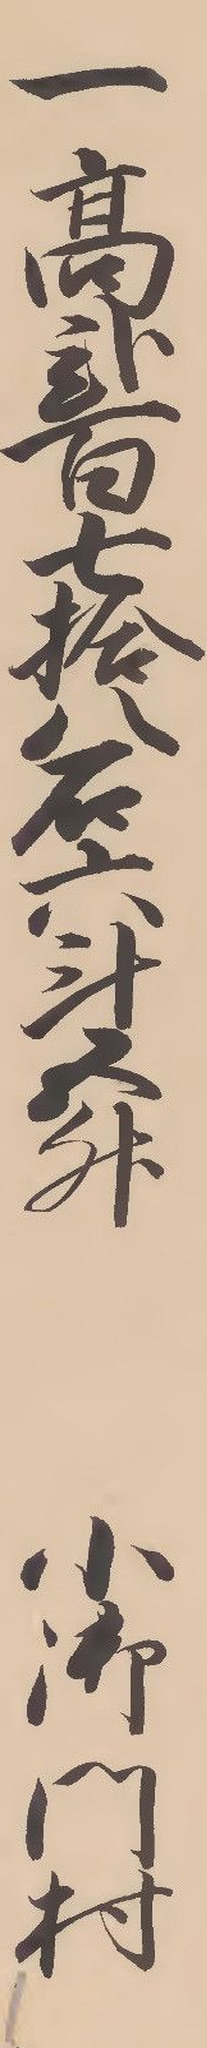一高弐百七拾八石六斗五升小御門村
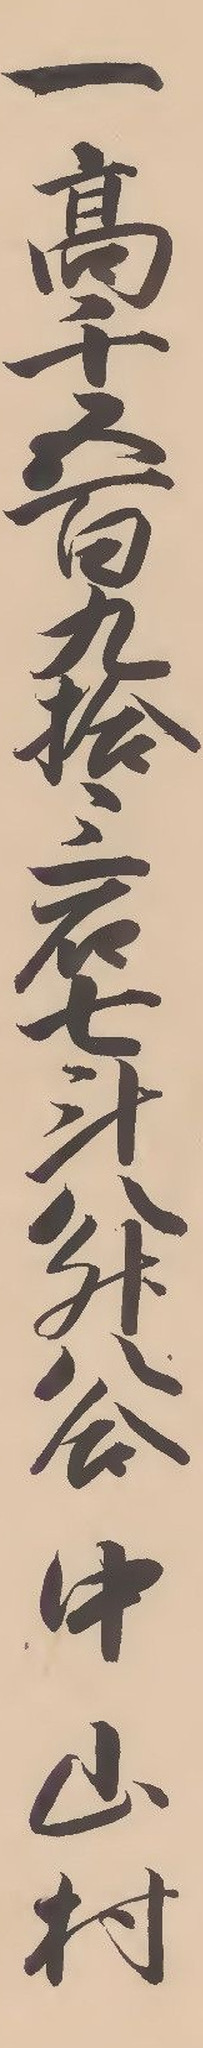一高千五百九拾三石七斗八升八合中山村

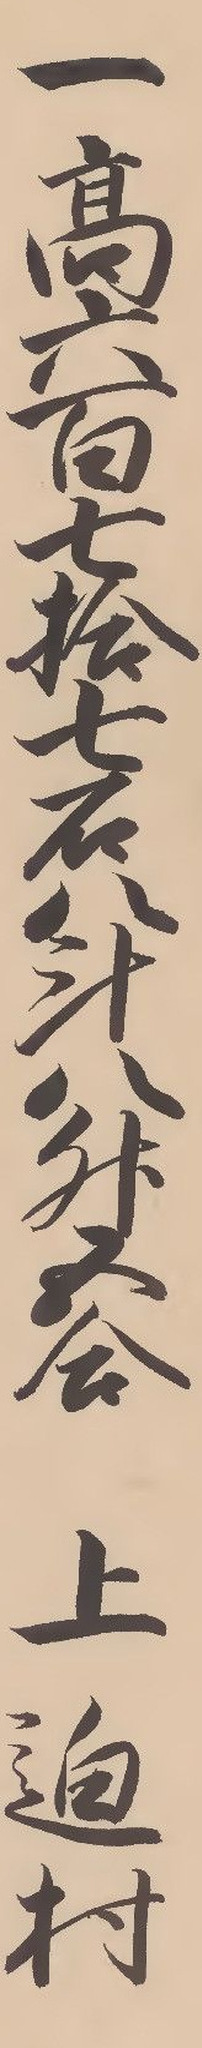一高六百七拾七石八斗八升五合上迫村
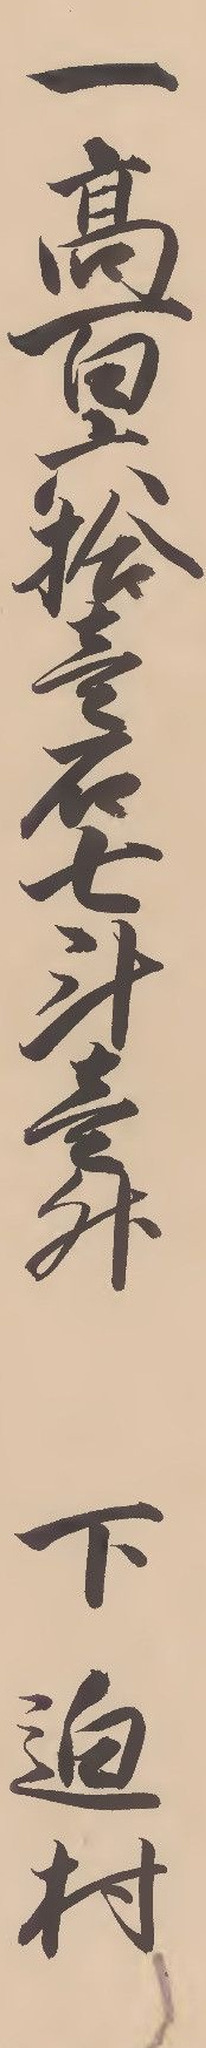一高百六拾壱石七斗壱升下迫村
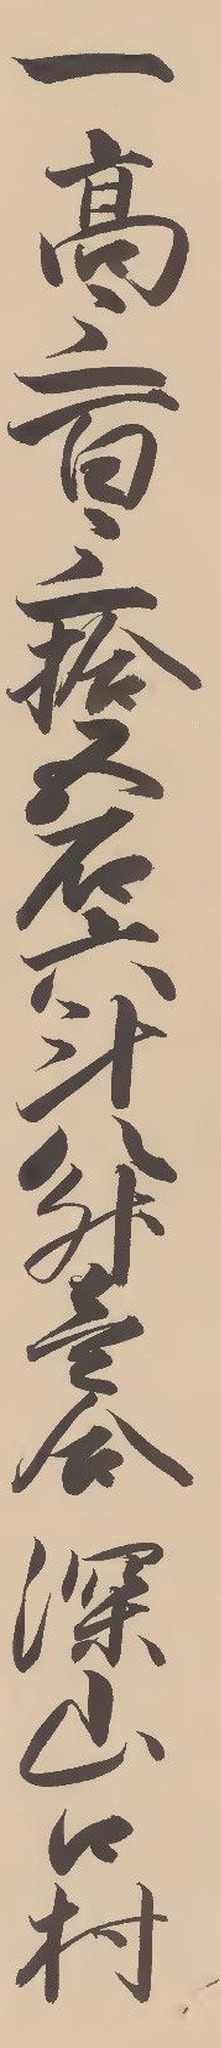一高三百三拾五石六斗八升壱合深山口村
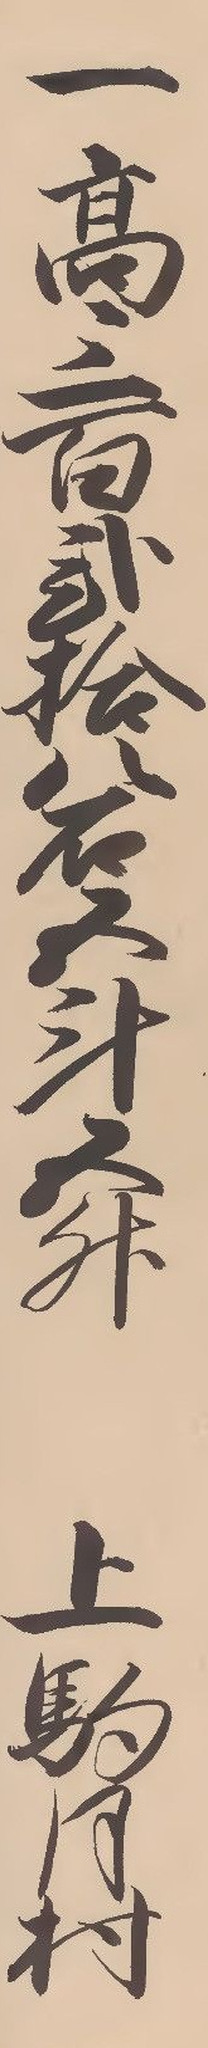一高三百弐拾八石五斗五升上駒月村
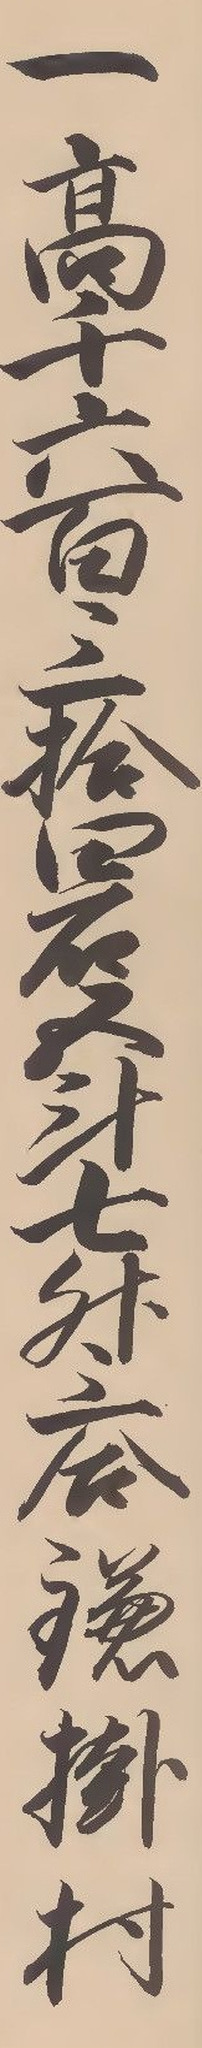一高千六百三拾四石五斗七升三合鎌掛村
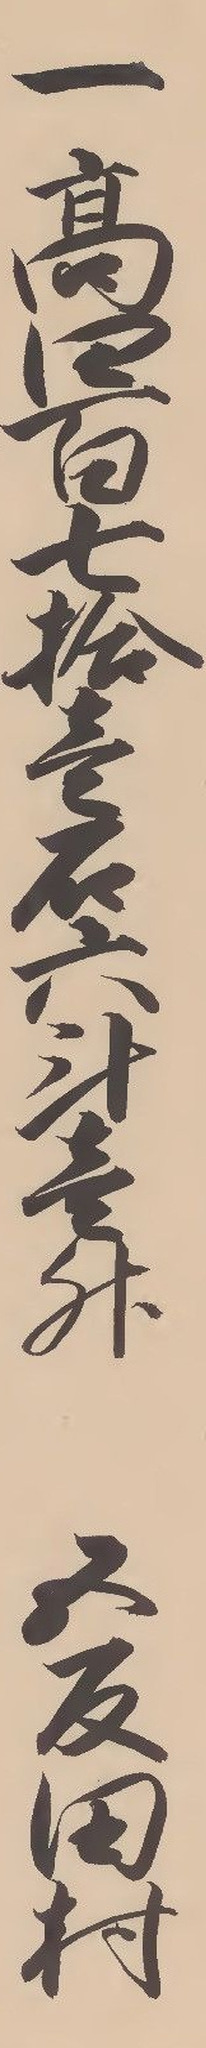一高四百七拾壱石六斗壱升五反田村
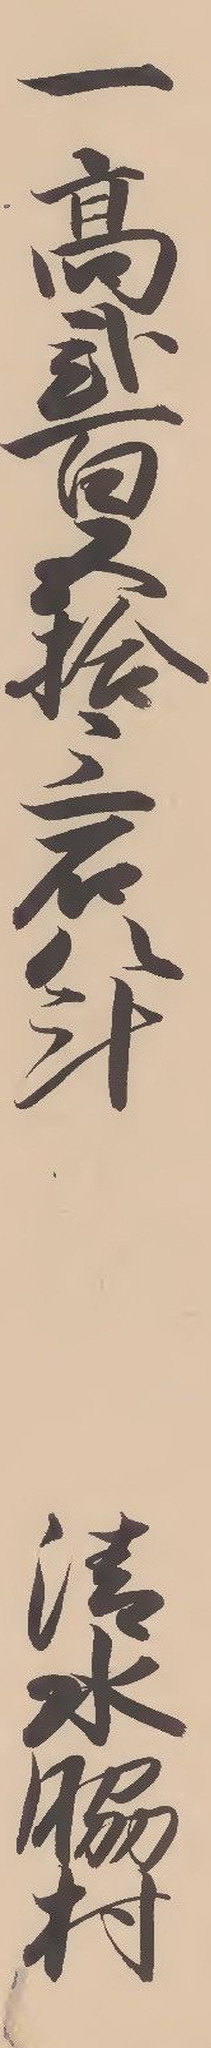一高弐百五拾三石八斗清水脇村
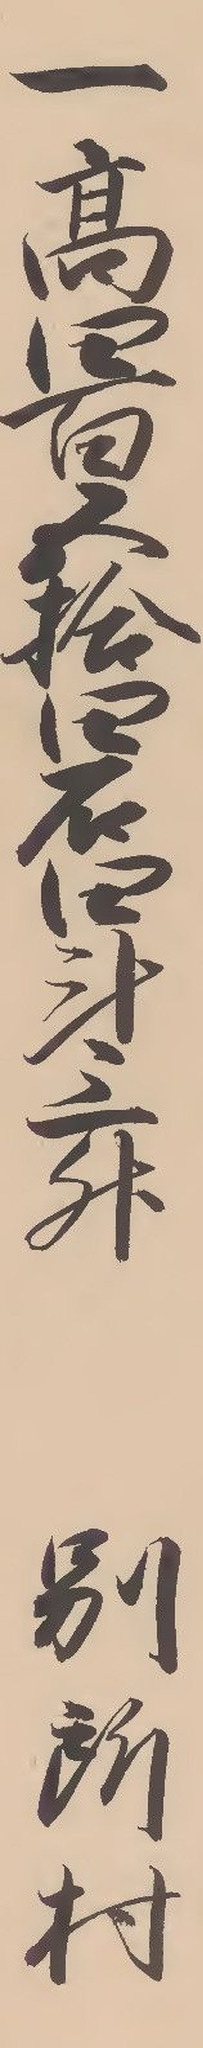一高四百五拾四石四斗三升別所村

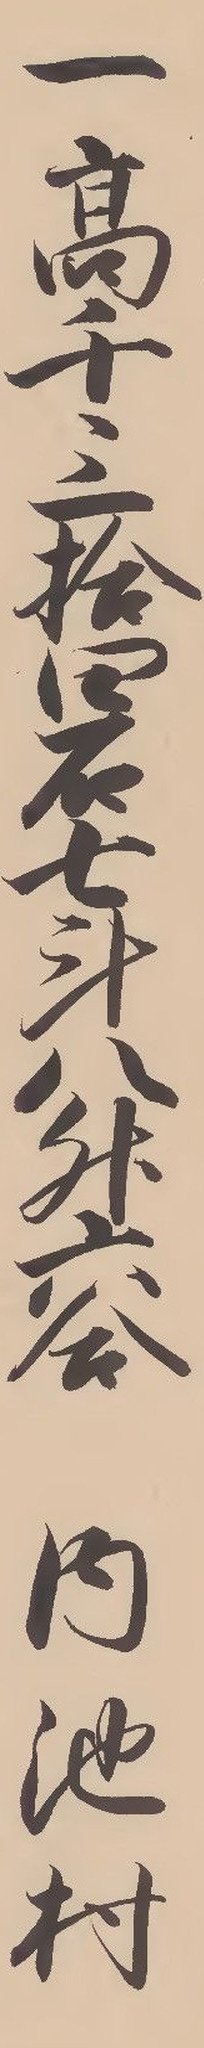一高千三拾四石七斗八升六合内池村
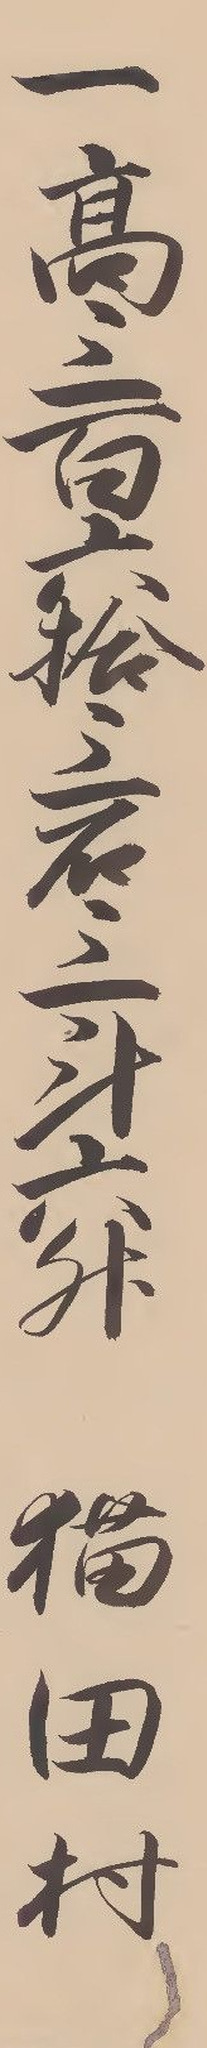一高三百六拾三石三斗六升猫田村
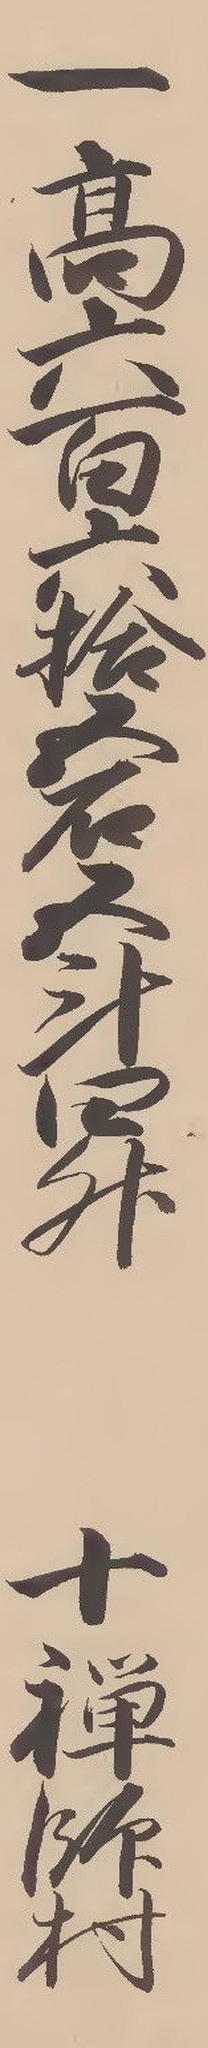一高六百六拾五石五斗四升十禅師村
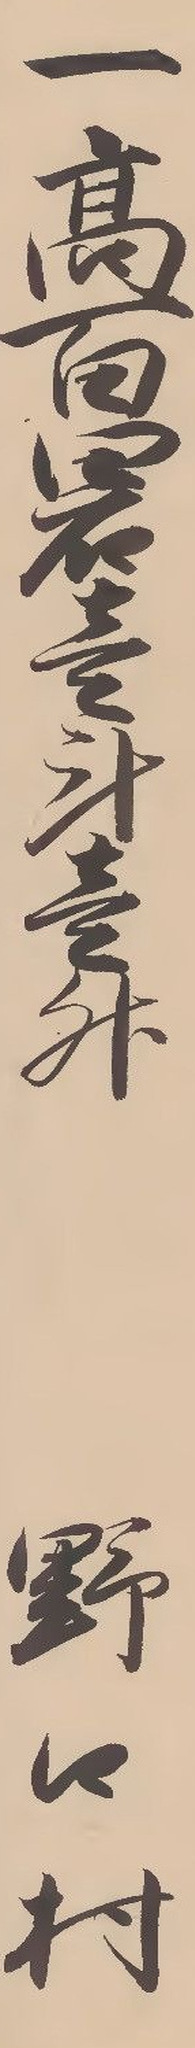一高百四石壱斗壱升野口村
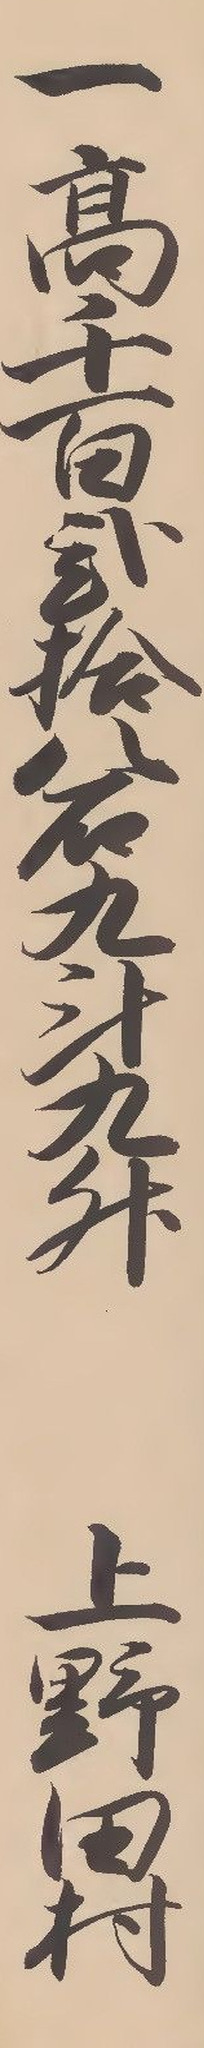一高千百弐拾八石九斗九升上野田村
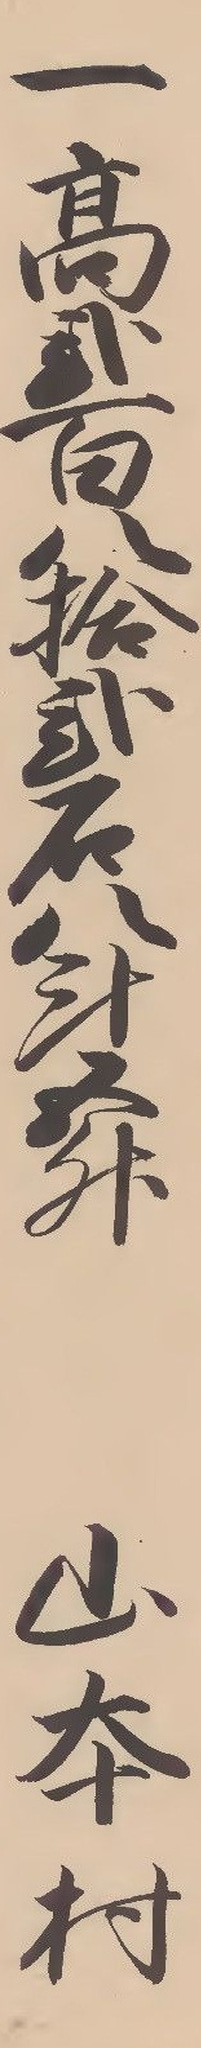一高弐百八拾弐石八斗五升山本村
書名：近江国郷帳
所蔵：国立公文書館 National Archives of Japan
